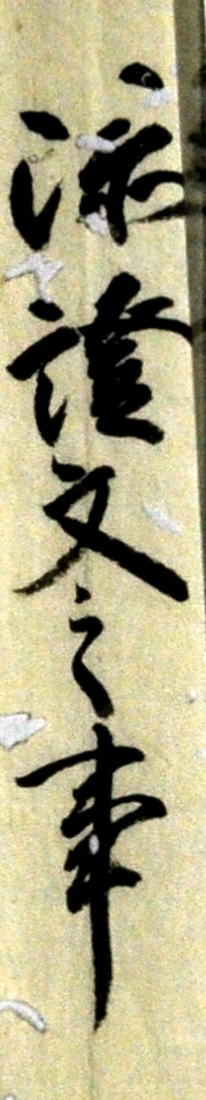添証文之事
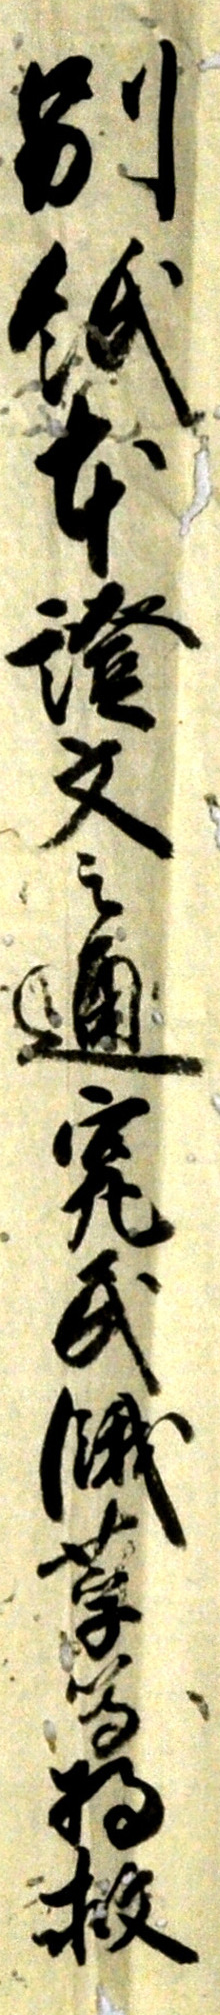別紙本証文之通究民餓莩等為救
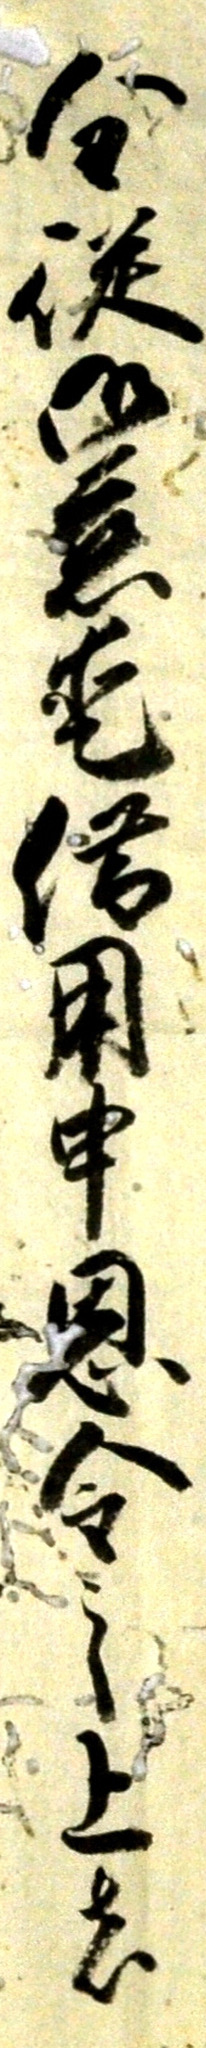金従御慈愛借用申恩令之上は
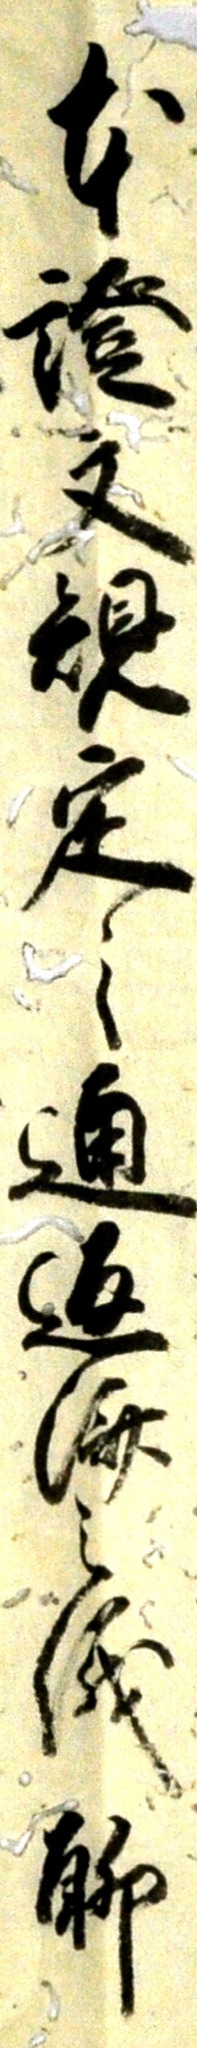本証文規定之通返済之儀聊
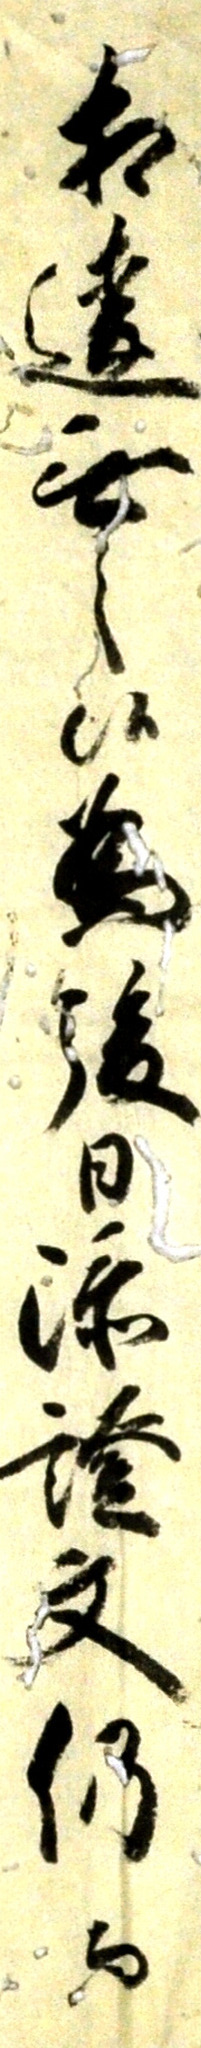相違無之候為後日添証文仍て
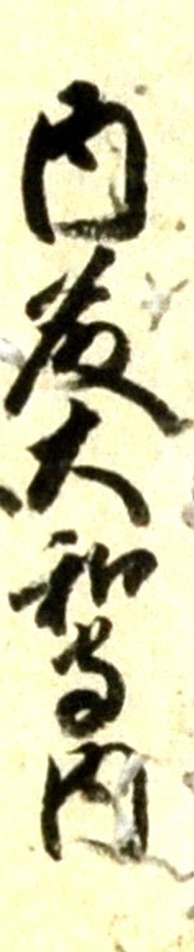内藤大和守内
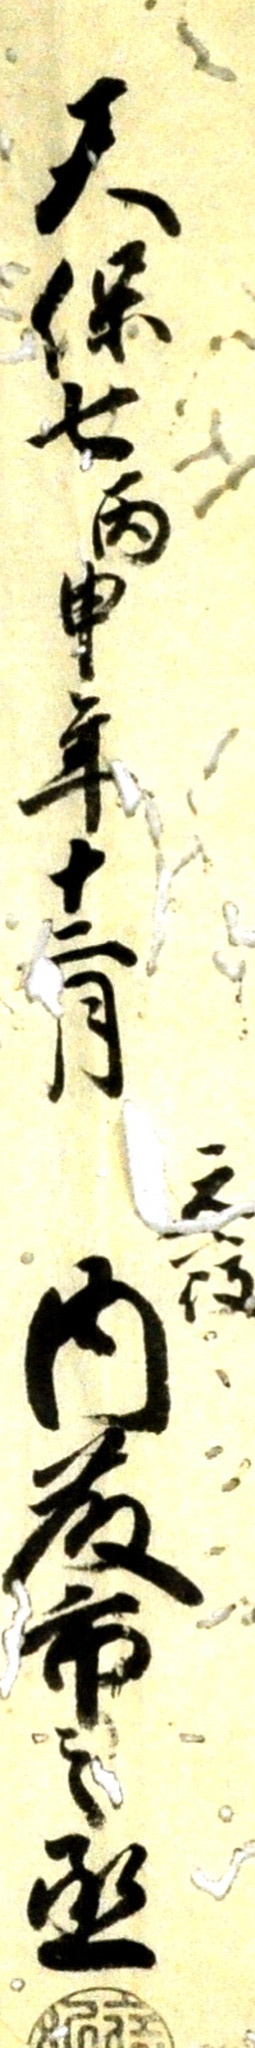天保七丙申年十二月内藤市之丞㊞
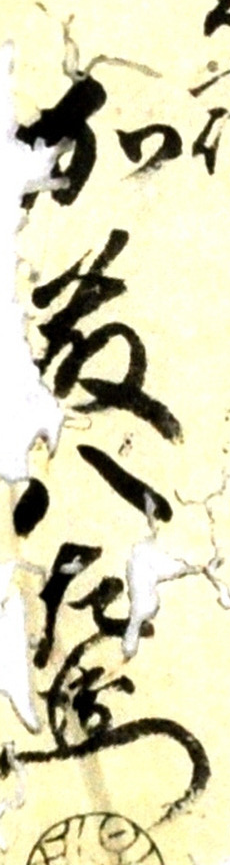加藤八左衛門㊞
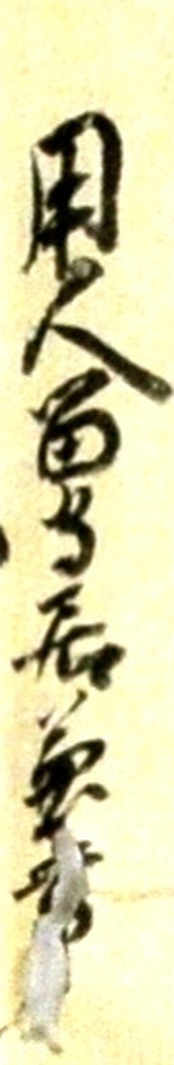用人留守居兼帯
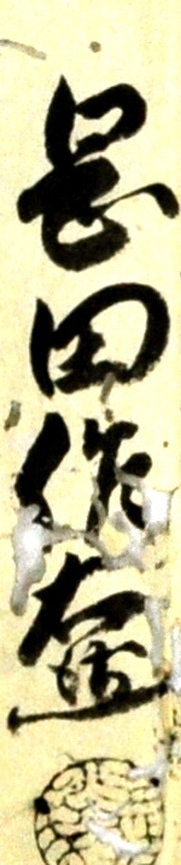岡田作右衛門㊞
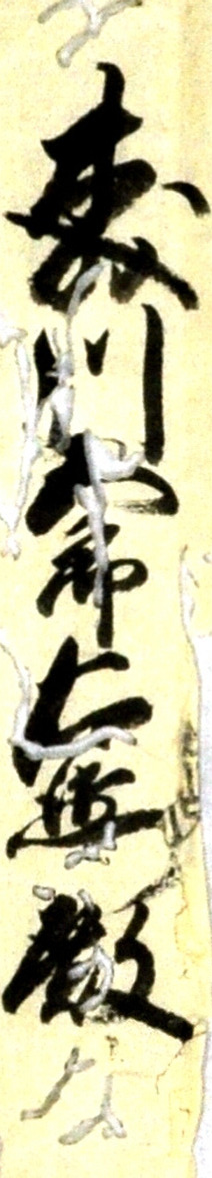森川五郎右衛門殿

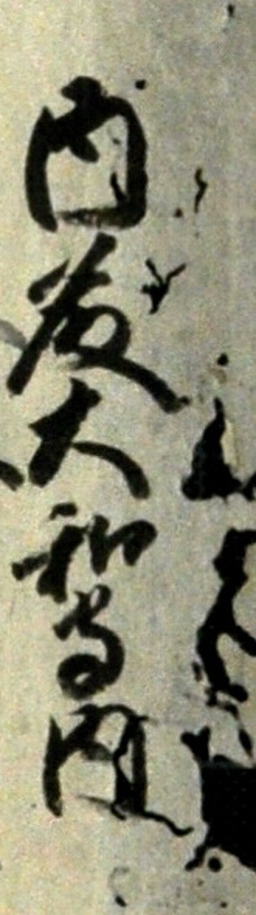内藤大和守内
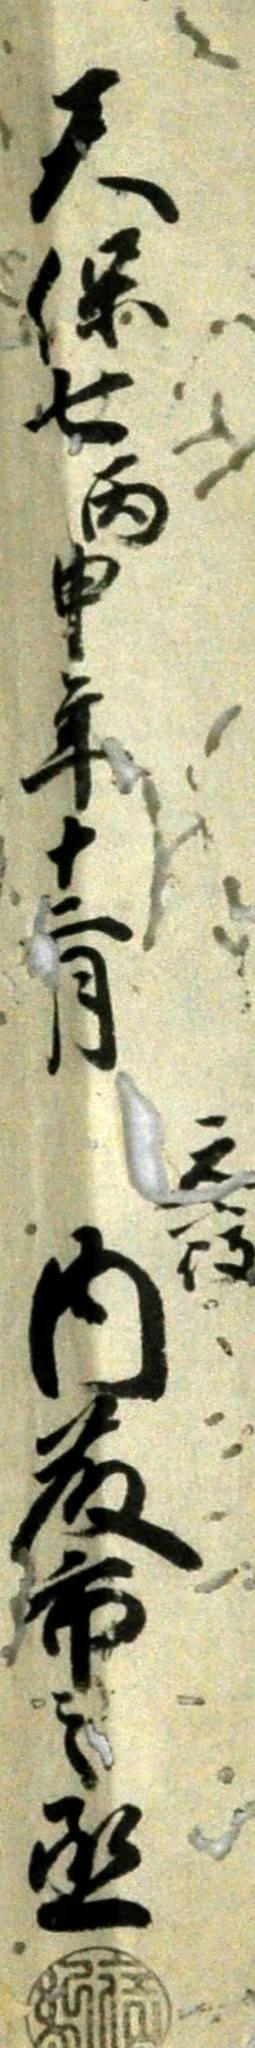天保七丙申年十二月内藤市之丞㊞
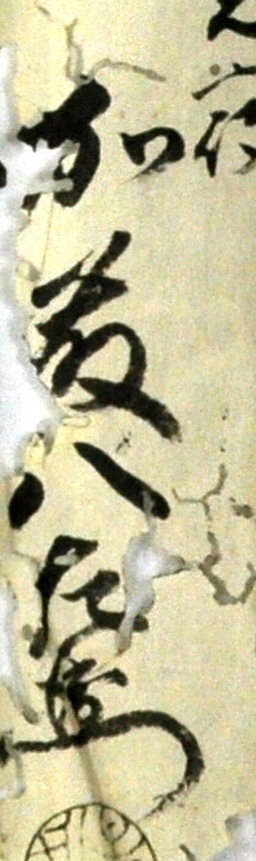加藤八左衛門㊞
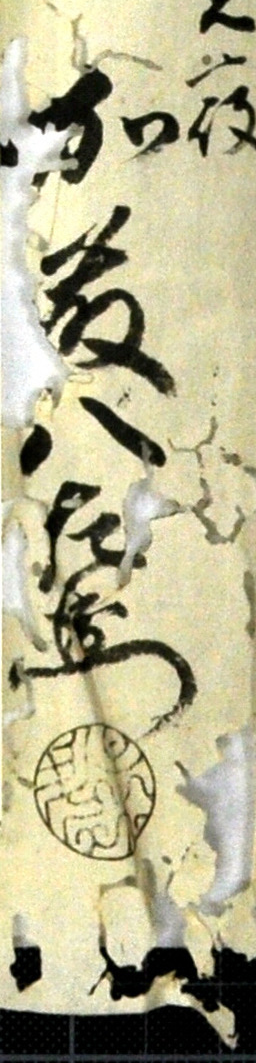加藤八左衛門㊞
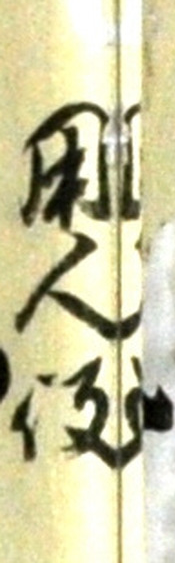用人役
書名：添証文之事
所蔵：伊那市立高遠町図書館・合同会社AMANE
